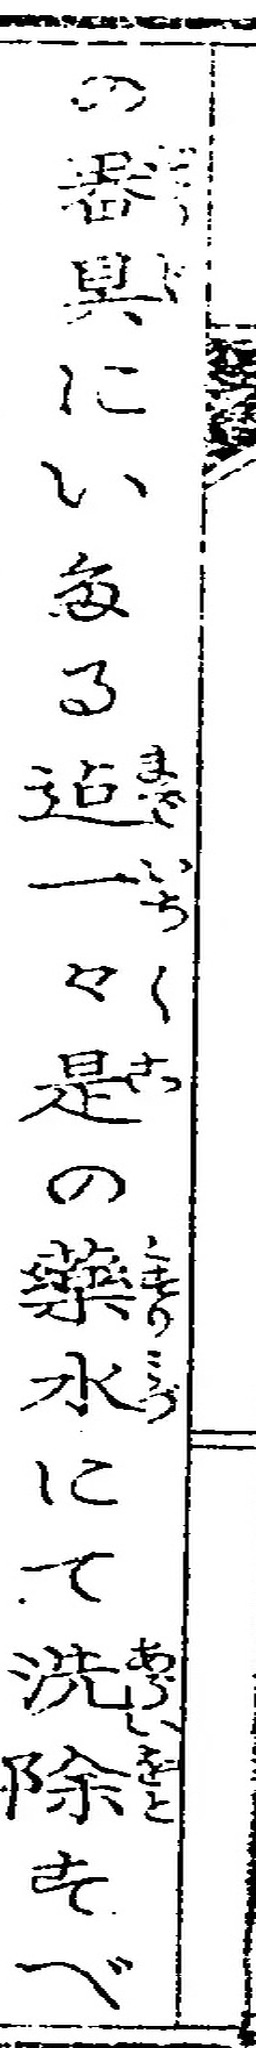の器具にいたる迄一々是の藥水にて洗除すべ
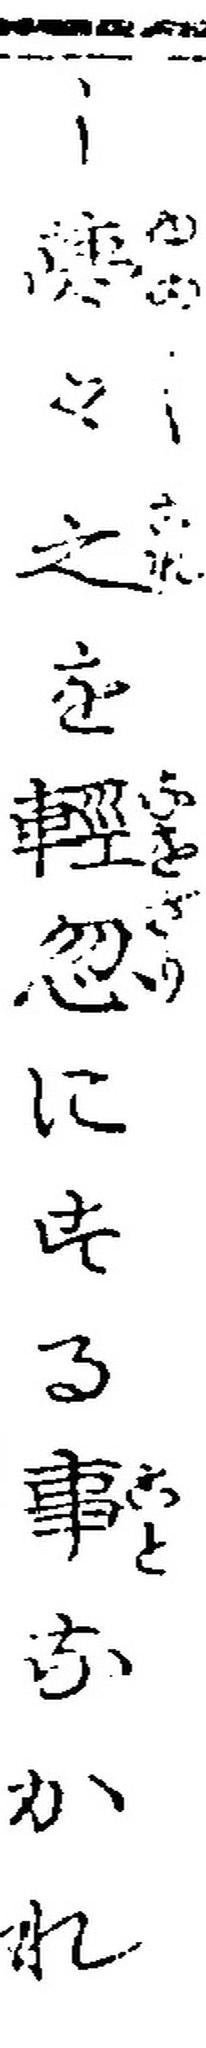し夢々之を輕忽にする事なかれ
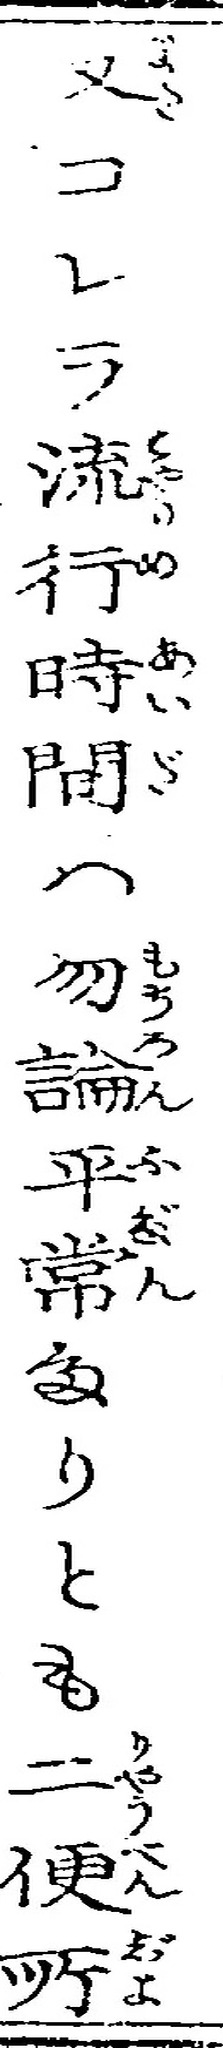又コレラ流行時間は勿論平常たりとも二便所
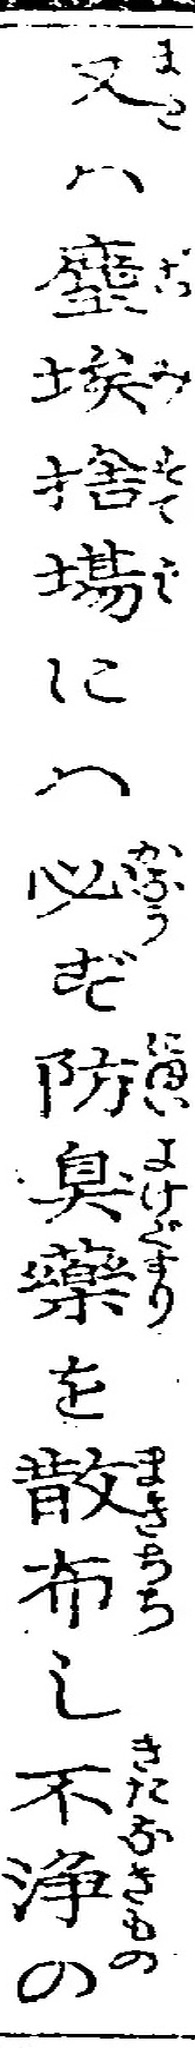又は塵埃捨場には必ず防臭藥を散布し不浄の
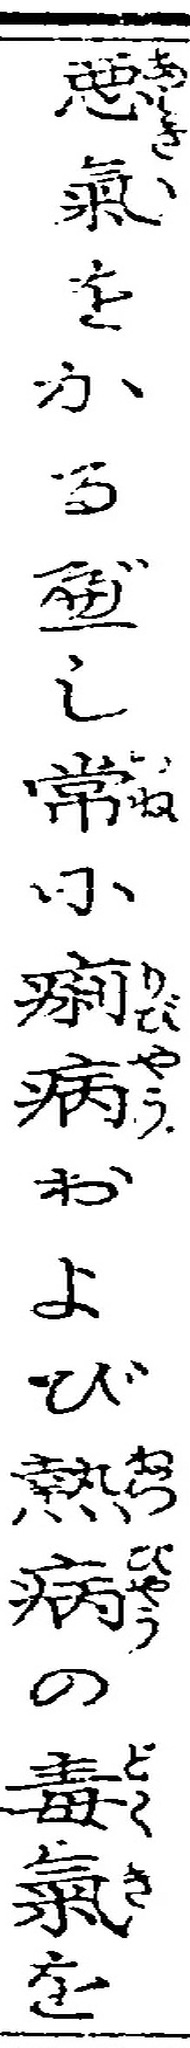悪気をかるべし常に痢病および熱病の毒氣を
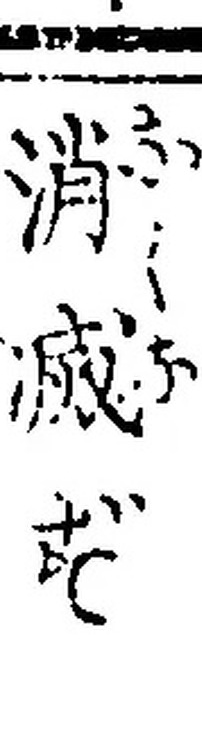消滅ず
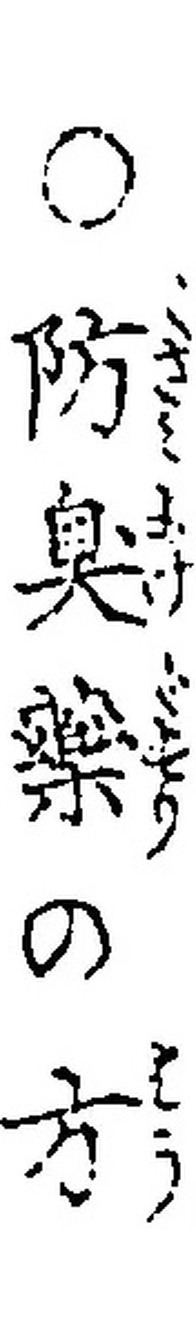〇防臭藥の方
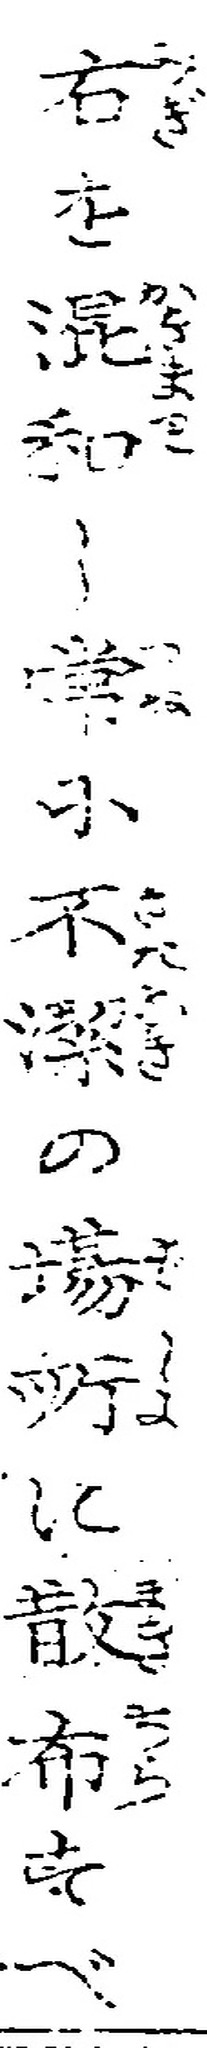右を混和し常に不潔の場所に散布すべ
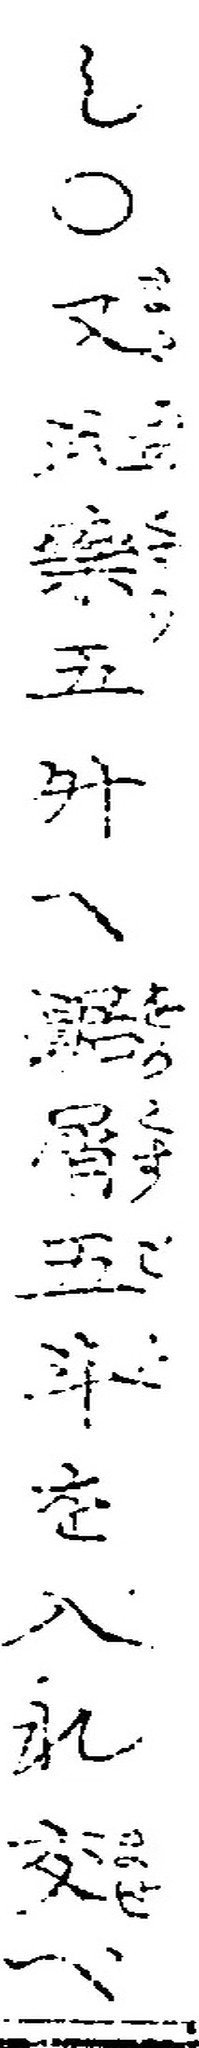し〇又藥五升へ鋸屑五北を入れ交べ
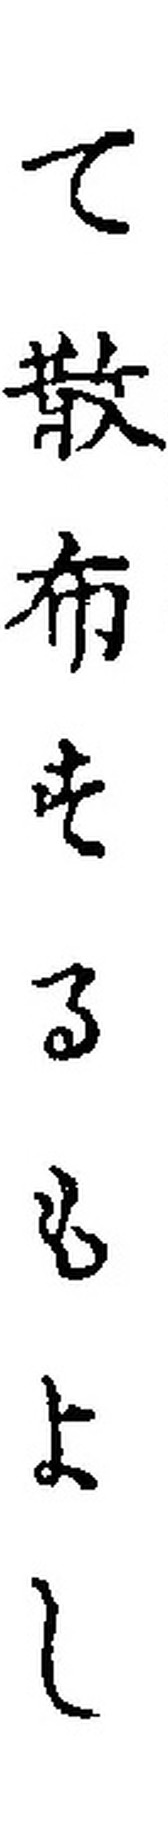て散布するもよし
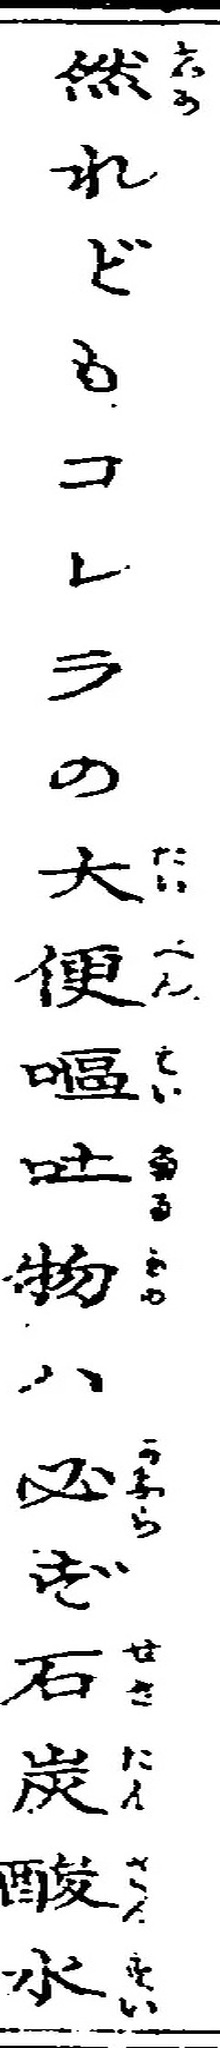然れどもコレラの大便嘔吐物は必ず石炭酸水
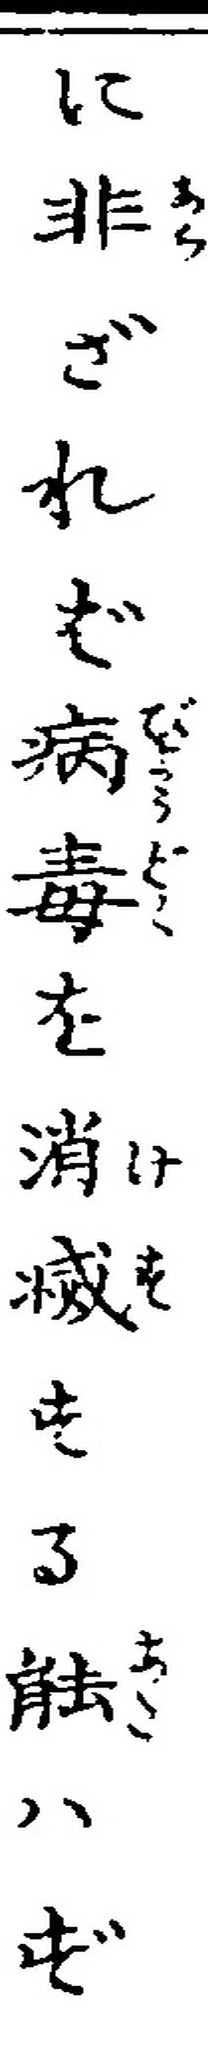に非ざれば病毒を消滅する能はず
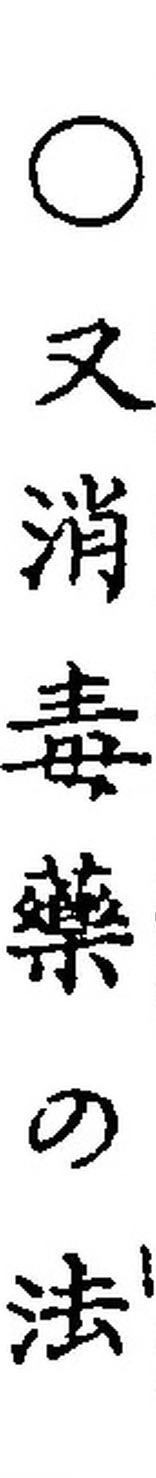〇又消毒藥の法
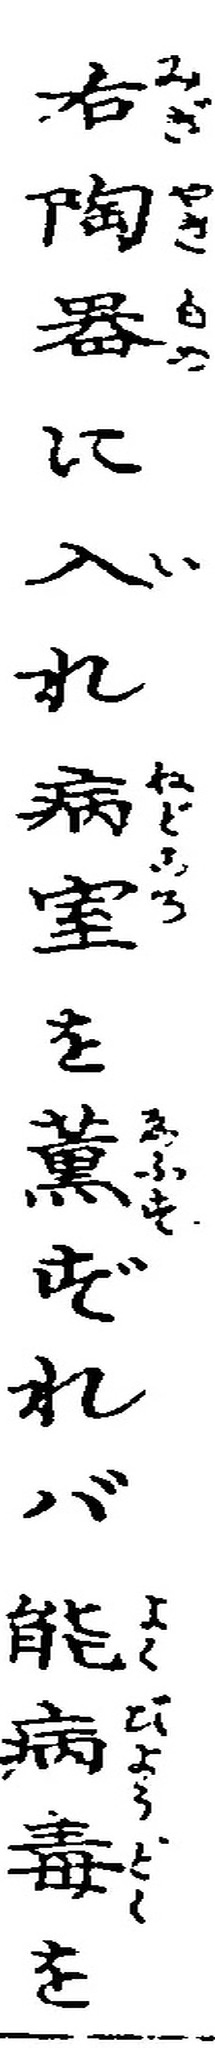右陶器に入れ病室を薫ずれば能病毒を
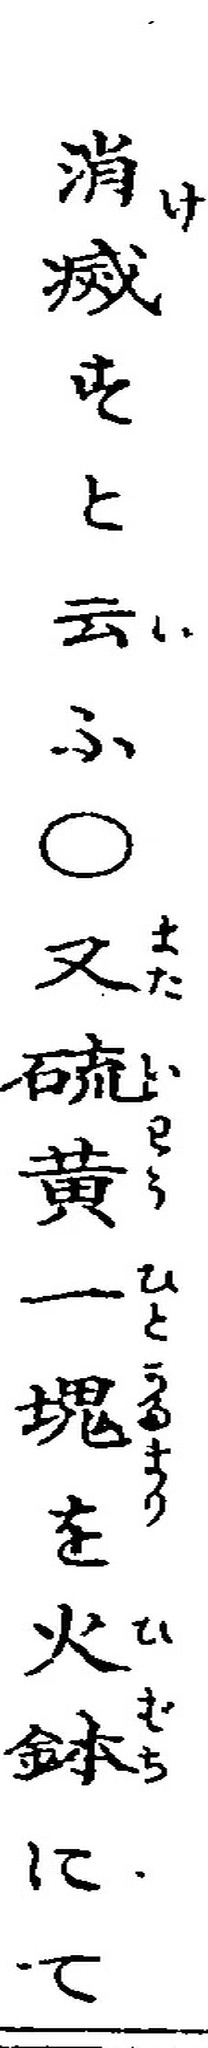消滅すと云ふ〇又硫黄一塊を火鉢にて
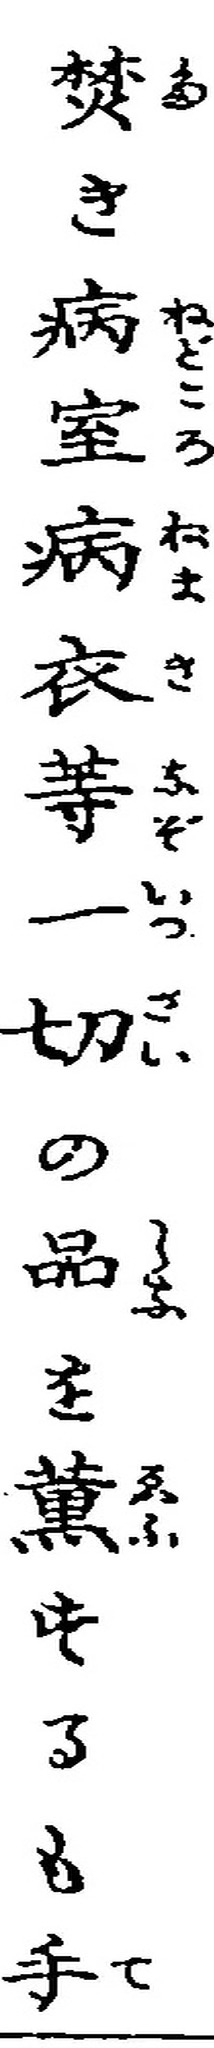焚き病室病衣等一切の品を薫するも手
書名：虎列剌予防民間の心得
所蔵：国立国会図書館 National Diet Library, JAPAN
